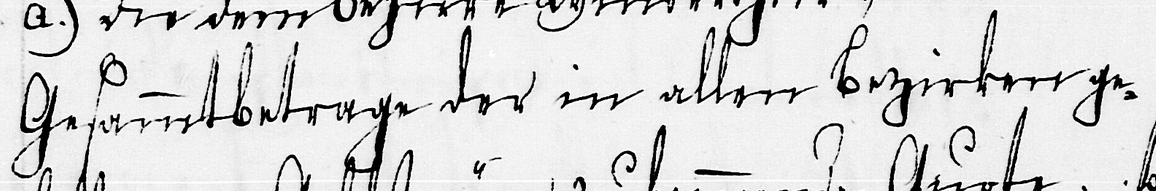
Gesammtbetrage der in allen Bezirken ge¬
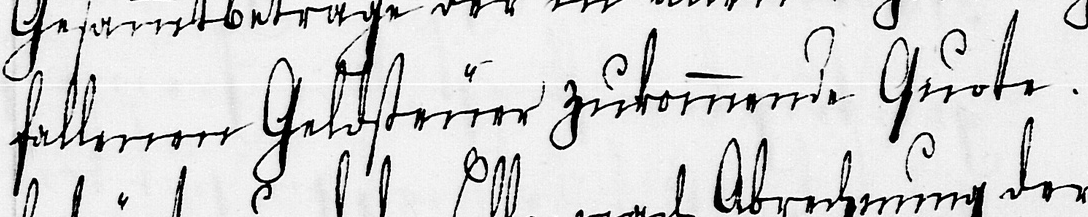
fallenen Geldsteuer zukommende Quote
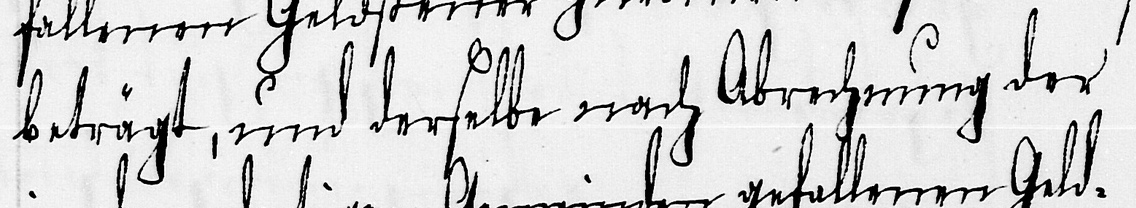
beträgt, und derselbe nach Abrechnung der
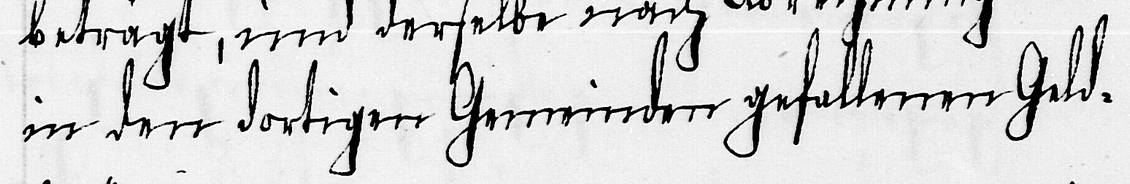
in den dortigen Gemeinden gefallenen Geld¬
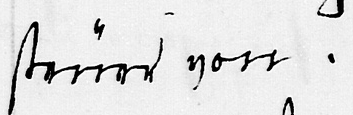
steuer von
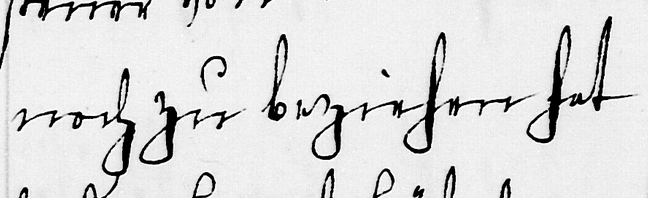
noch zu beziehen ha¬
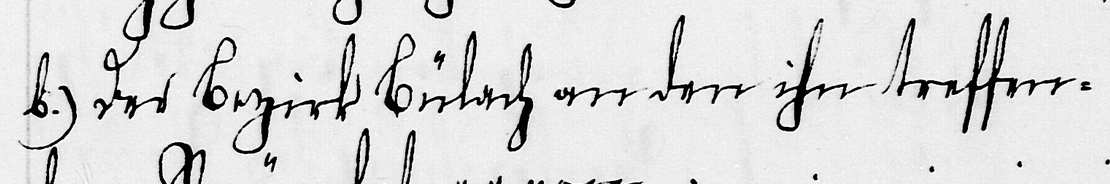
b.) Der Bezirk Bülach an den ihn treffen¬
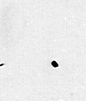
2.
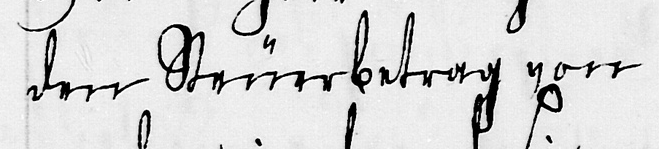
den Steuerbetrag von
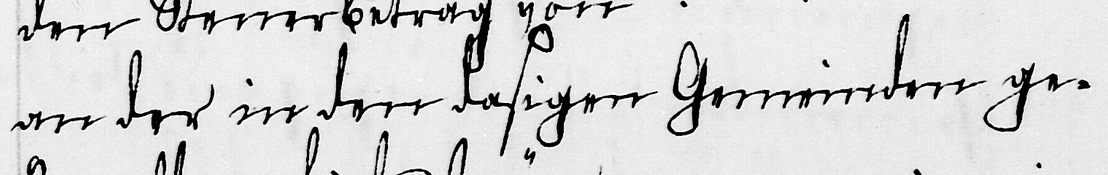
an der in den dasigen Gemeinden ge¬
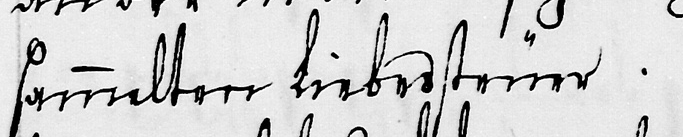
sammelten Liebessteuer
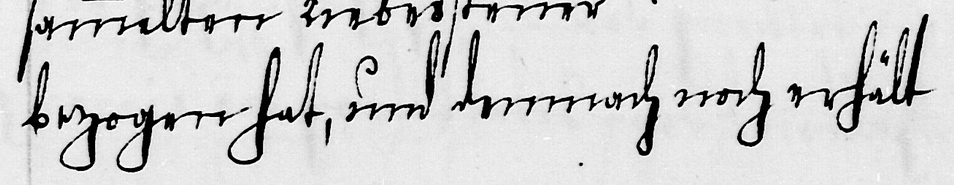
bezogen hat, und demnach noch erhält
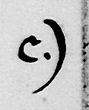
1.)
